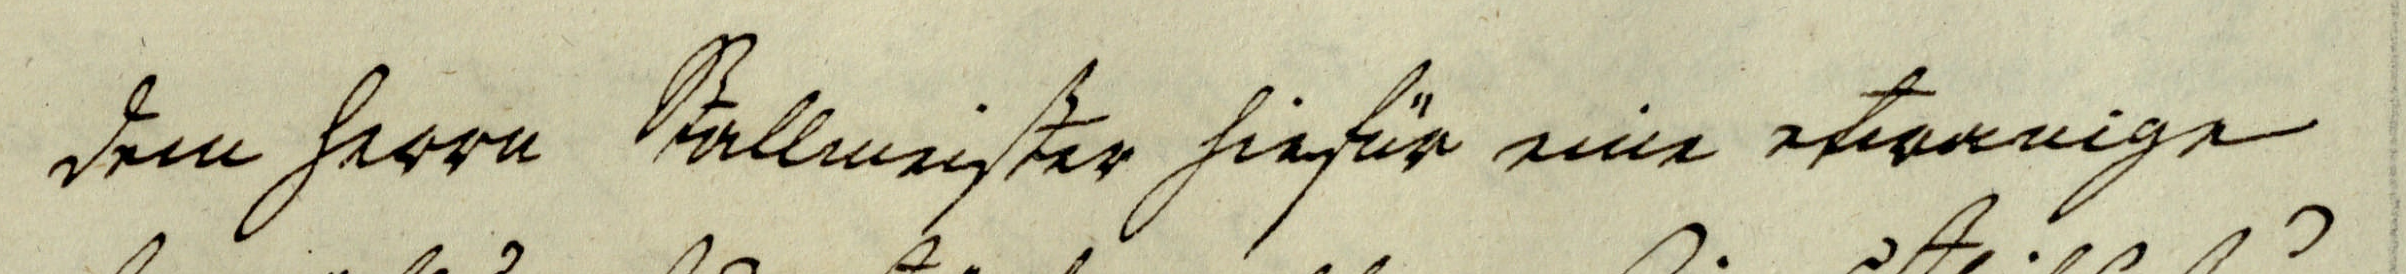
dem Herrn Stallmeister hiefür eine etwanige
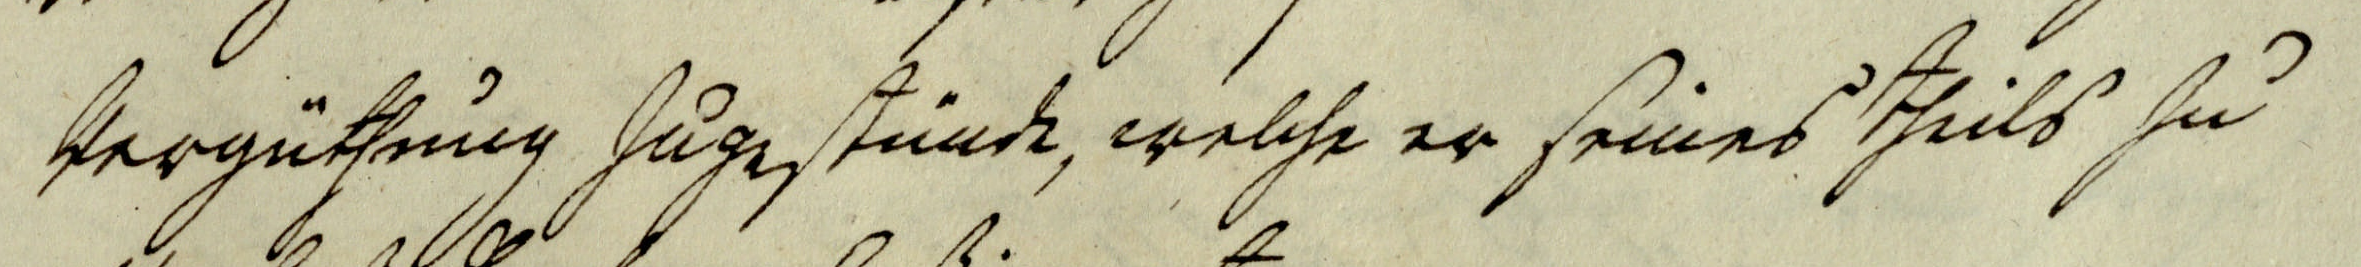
Vergüthung zugestünde, welche er seines Theils zu
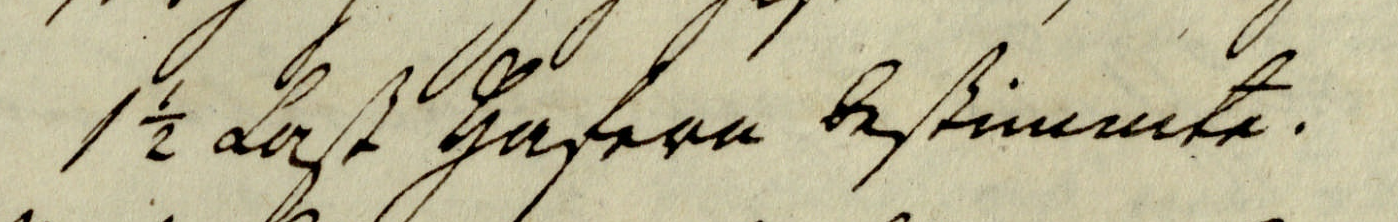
1½ Last Hafern bestimmte.
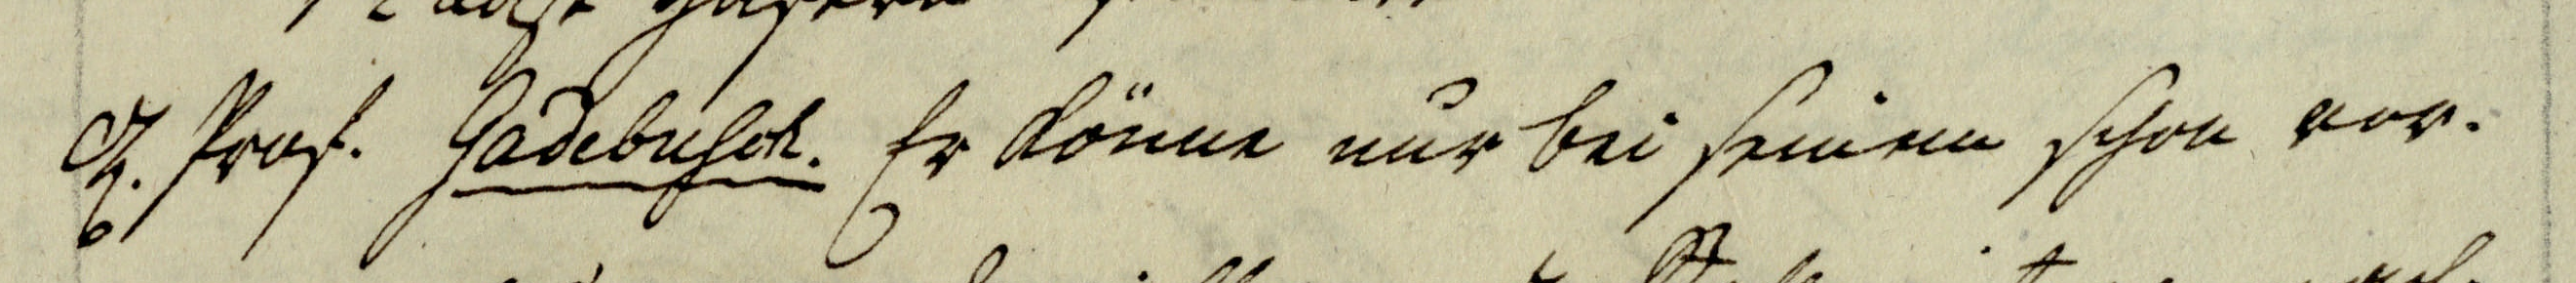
dh. Prof. Gadebusch. Er könne nur bei seinem schon vor¬
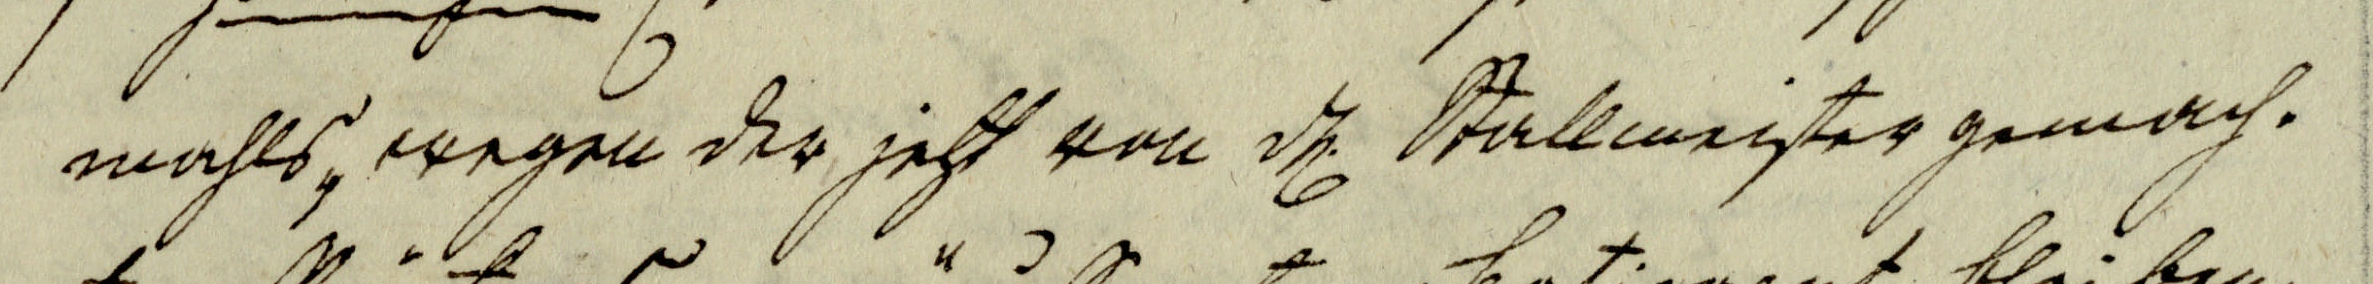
mahls, wegen der jetzt von dh. Stallmeister gemach¬
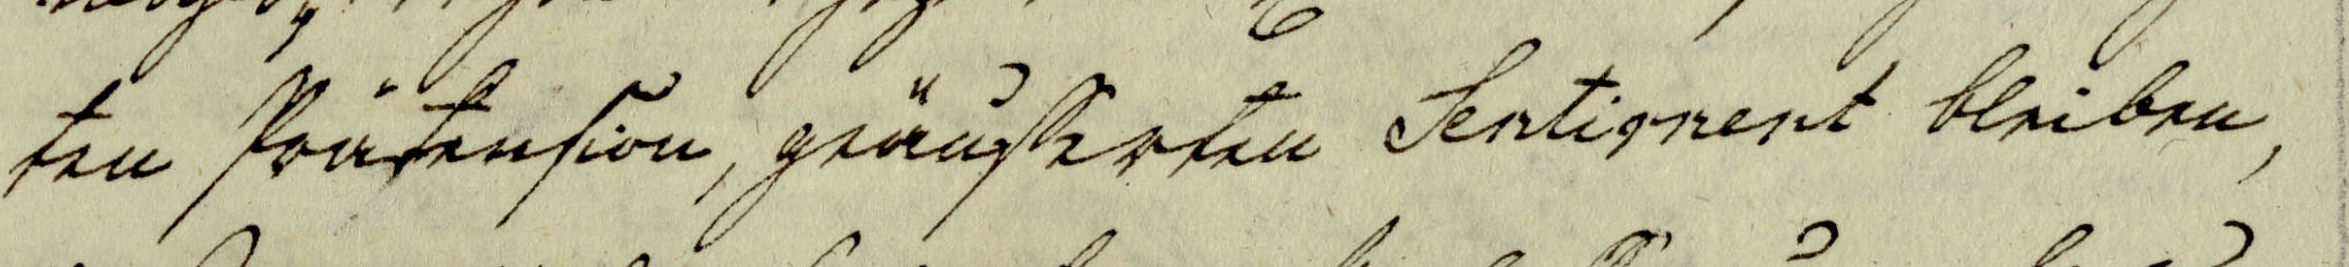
ten Prätension, geäusserten Sentiment bleiben,
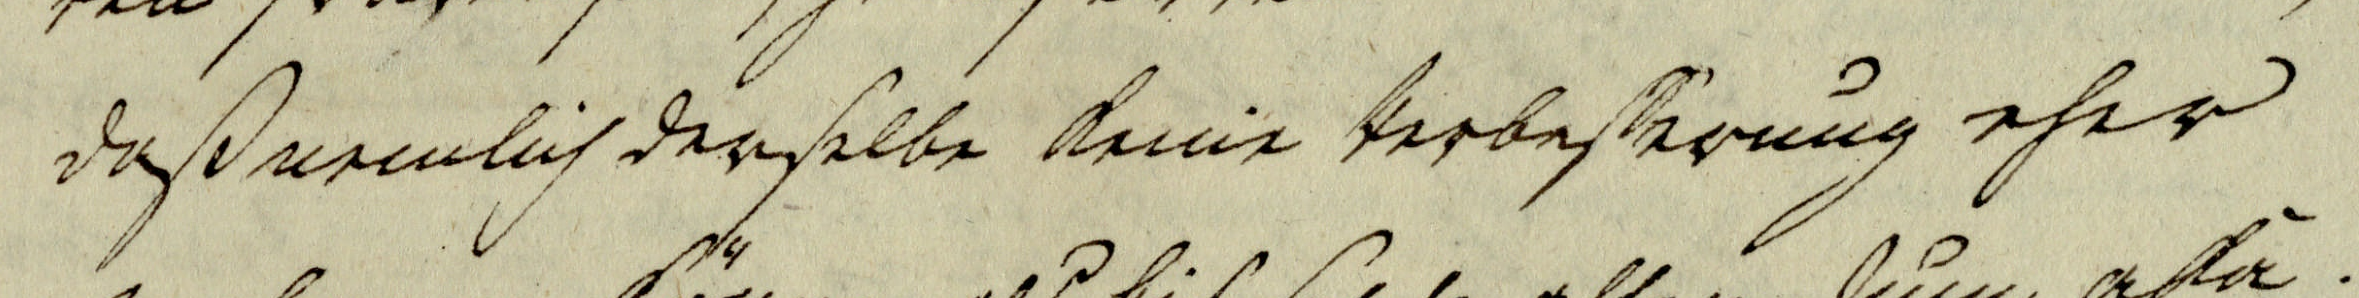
daß nemlich derselbe keine Verbesserung eher
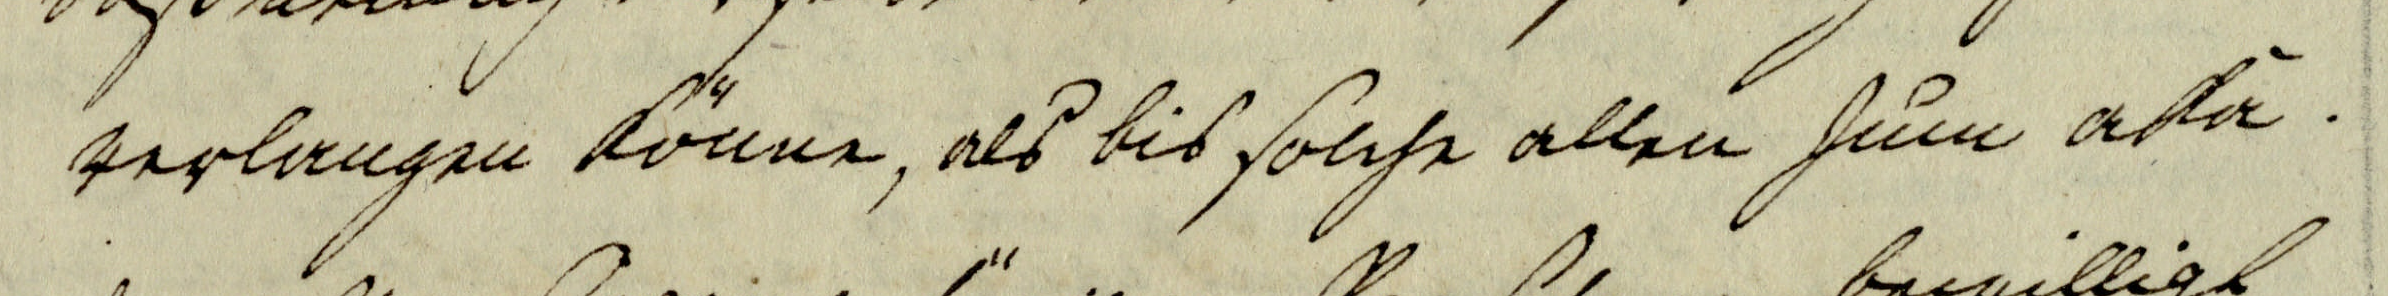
verlangen könne als bis solche allen zum aka¬
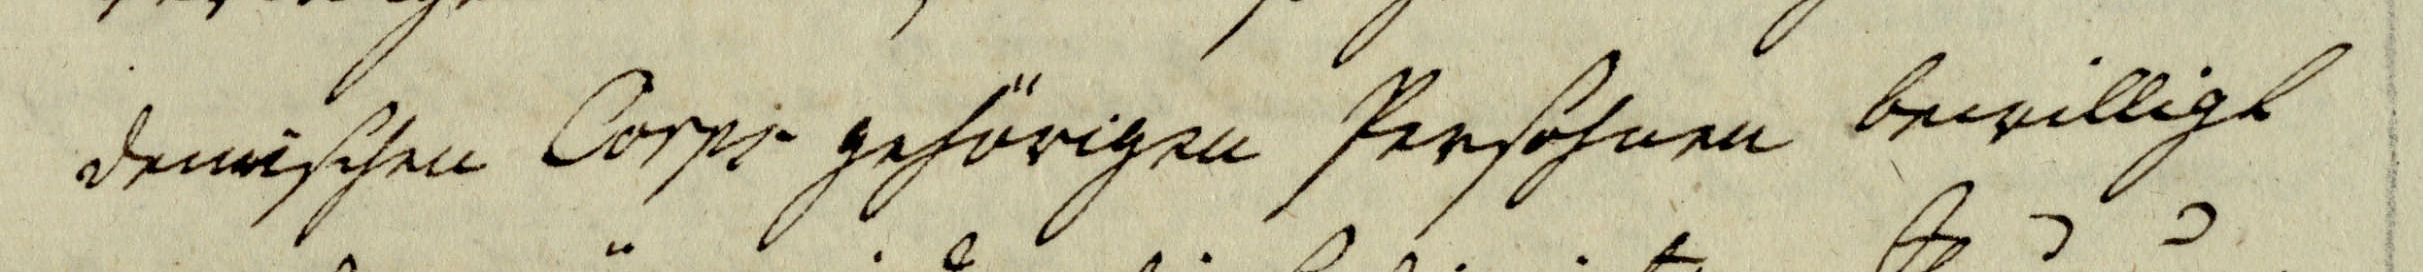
demischen Corps gehörigen Persohnen bewilligt
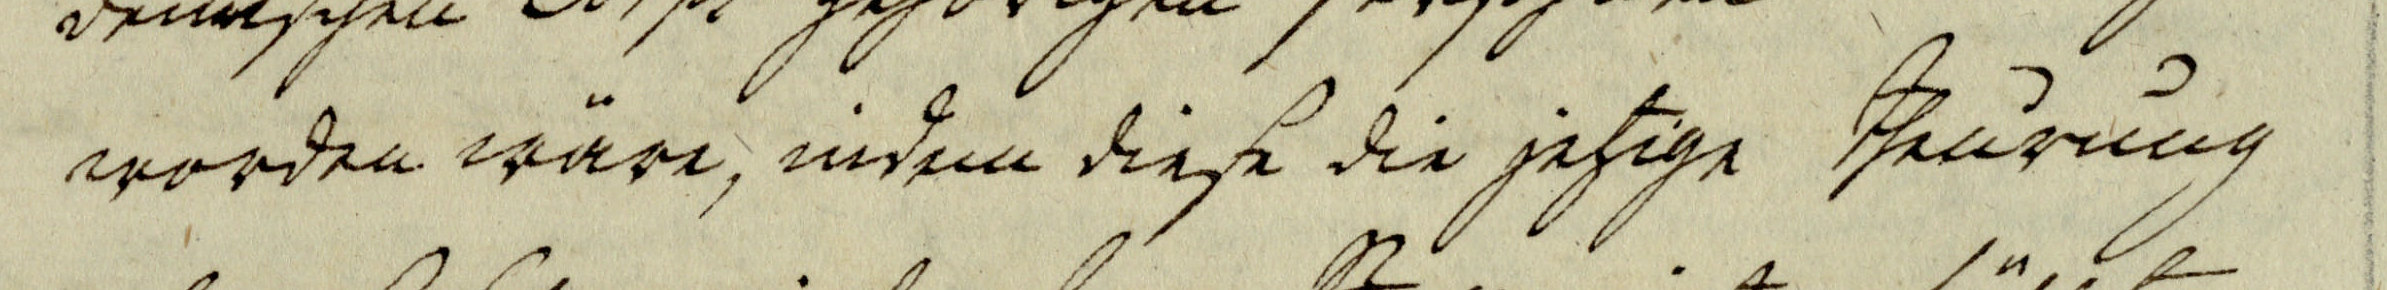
worden wäre, indem diese die jetzige Theurung
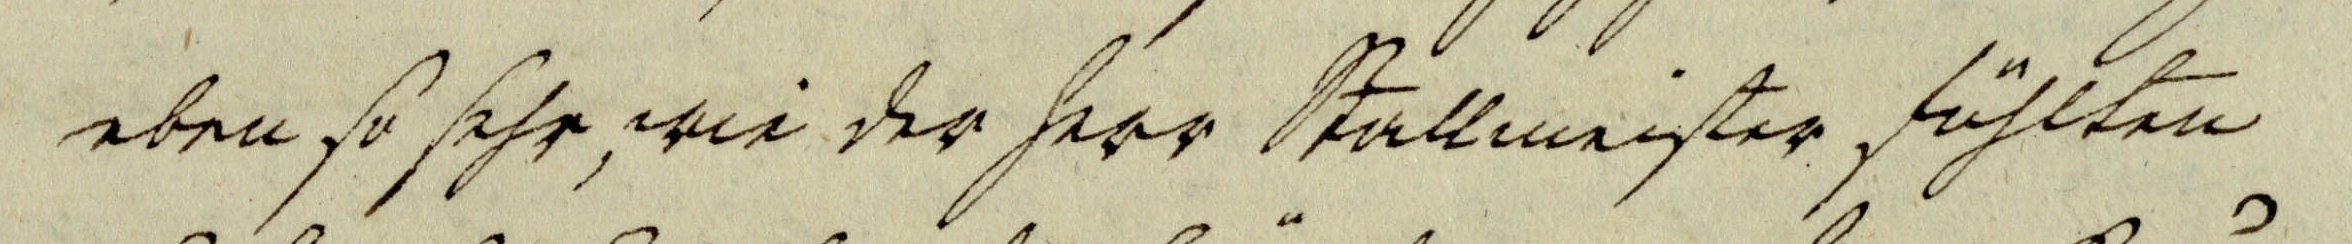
eben so sehr, wie der Herr Stallmeister fühlten
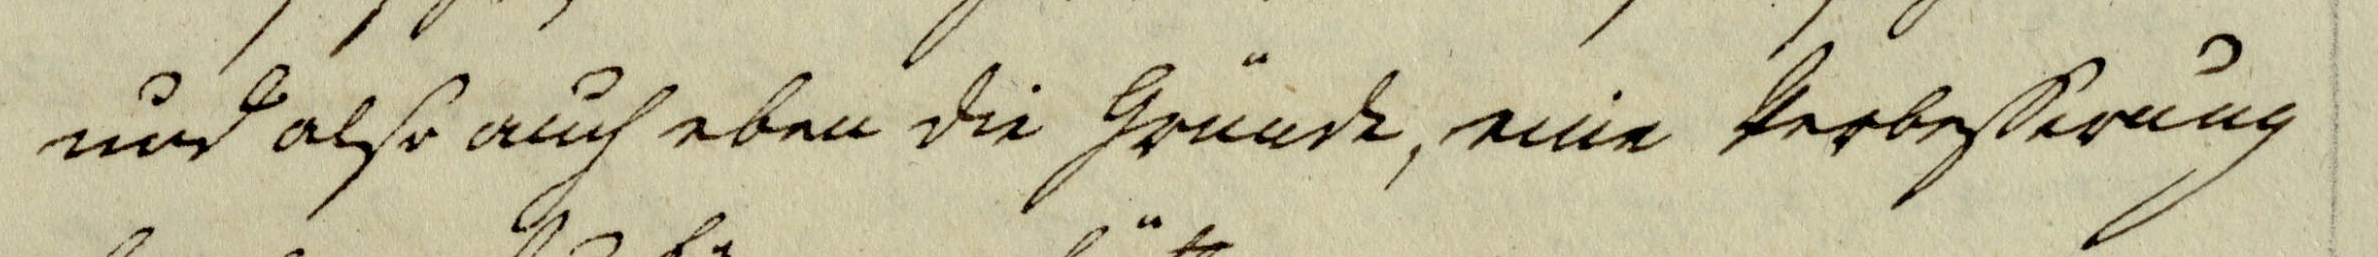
und also auch eben die Gründe, eine Verbesserung
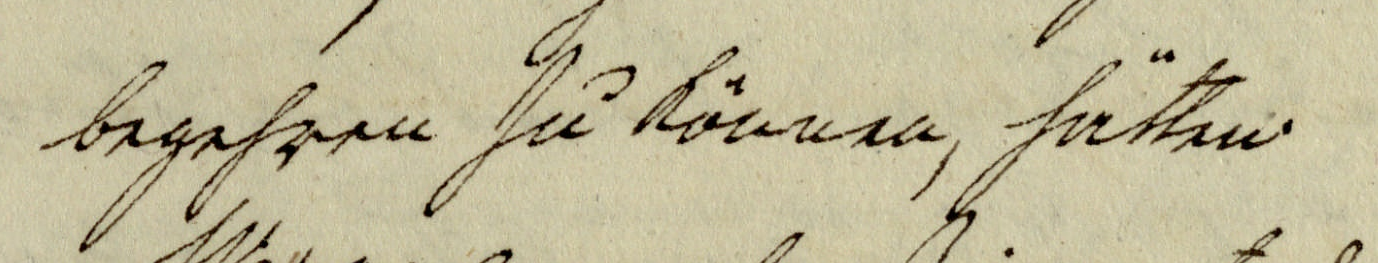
begehren zu können, hätten.
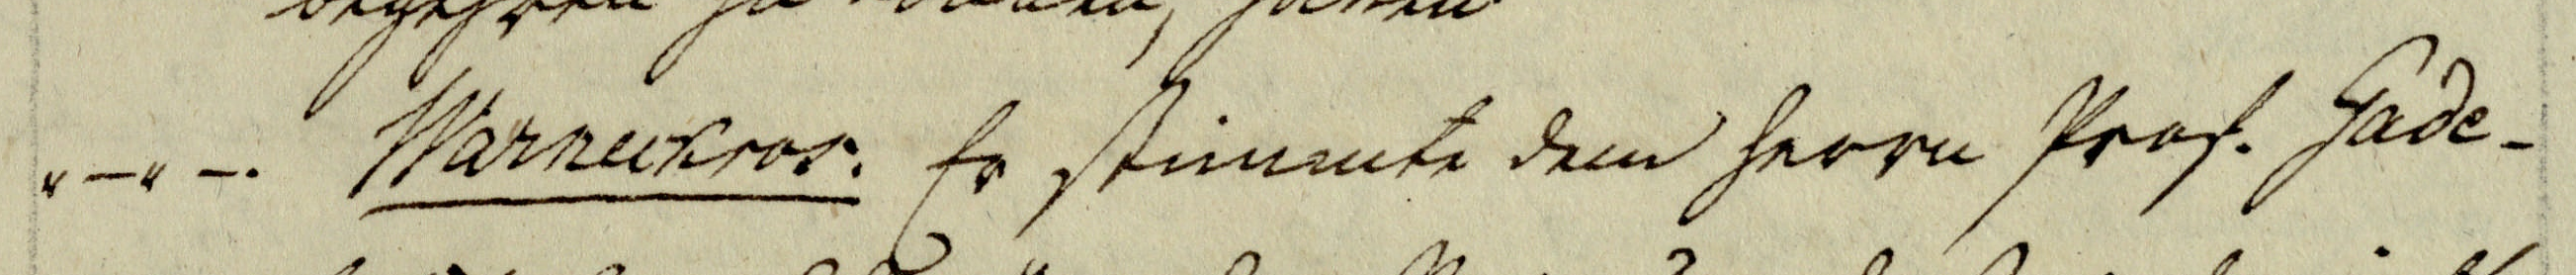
Warneckros. Er stimmte dem Herrn Prof. Gade¬
